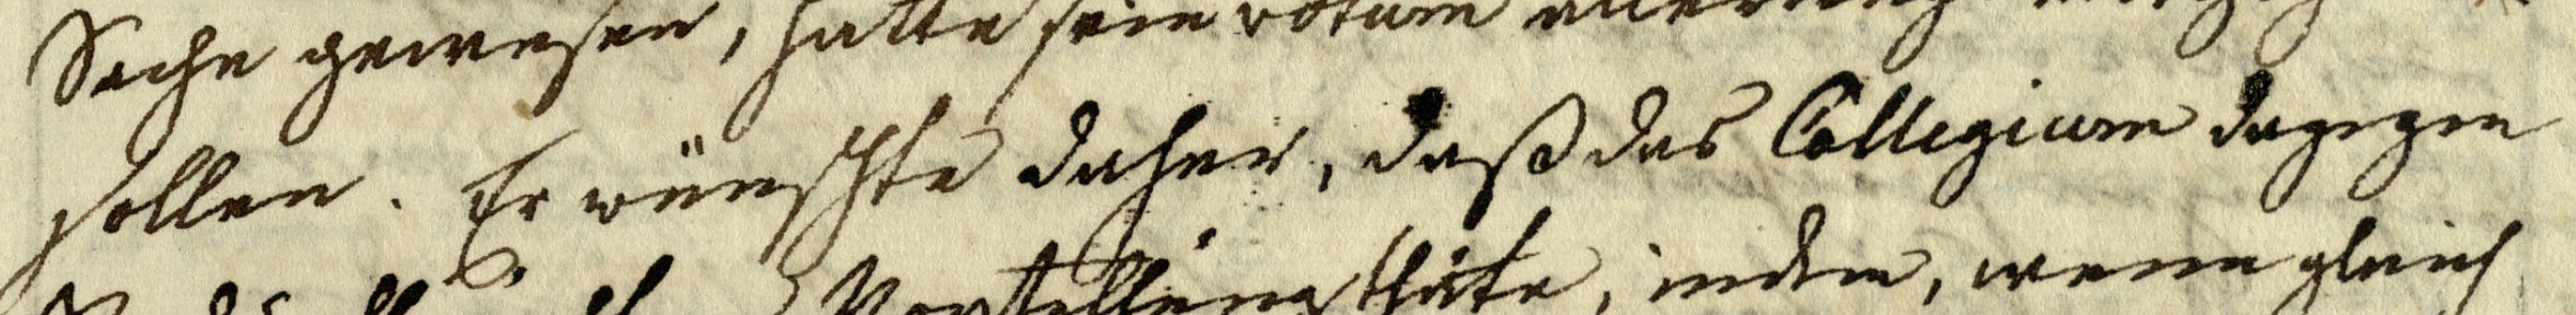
sollen. Er wünschte daher, daß das Collegium dagegen
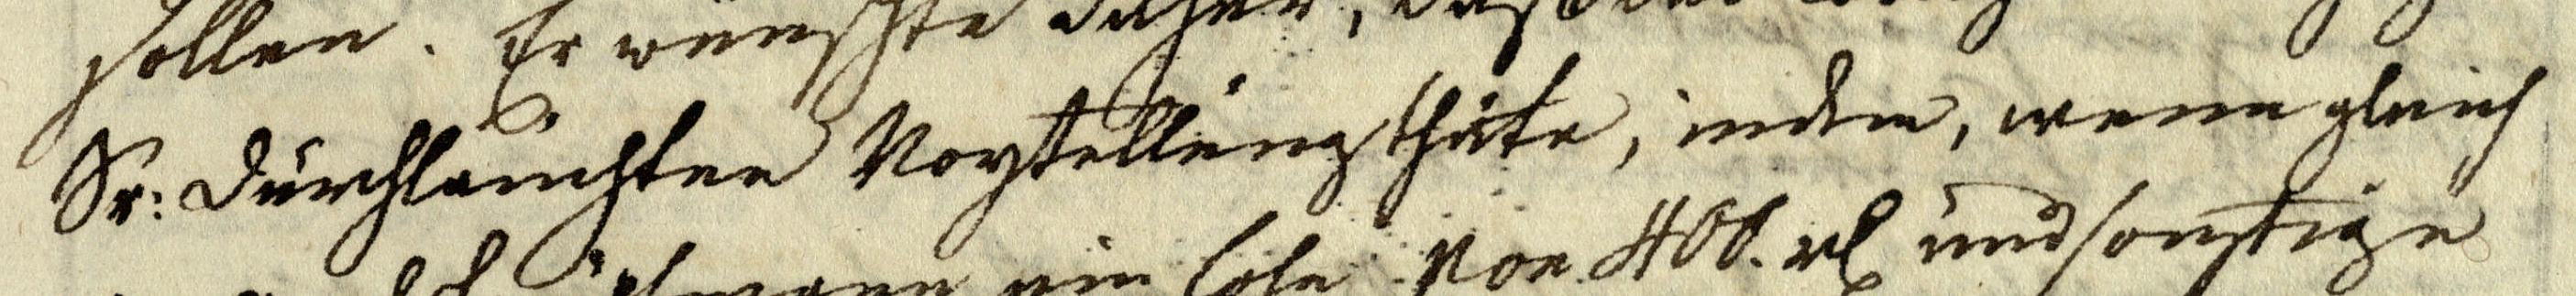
Sr. Durchlauchten Vorstellung thäte, indem, wenn gleich
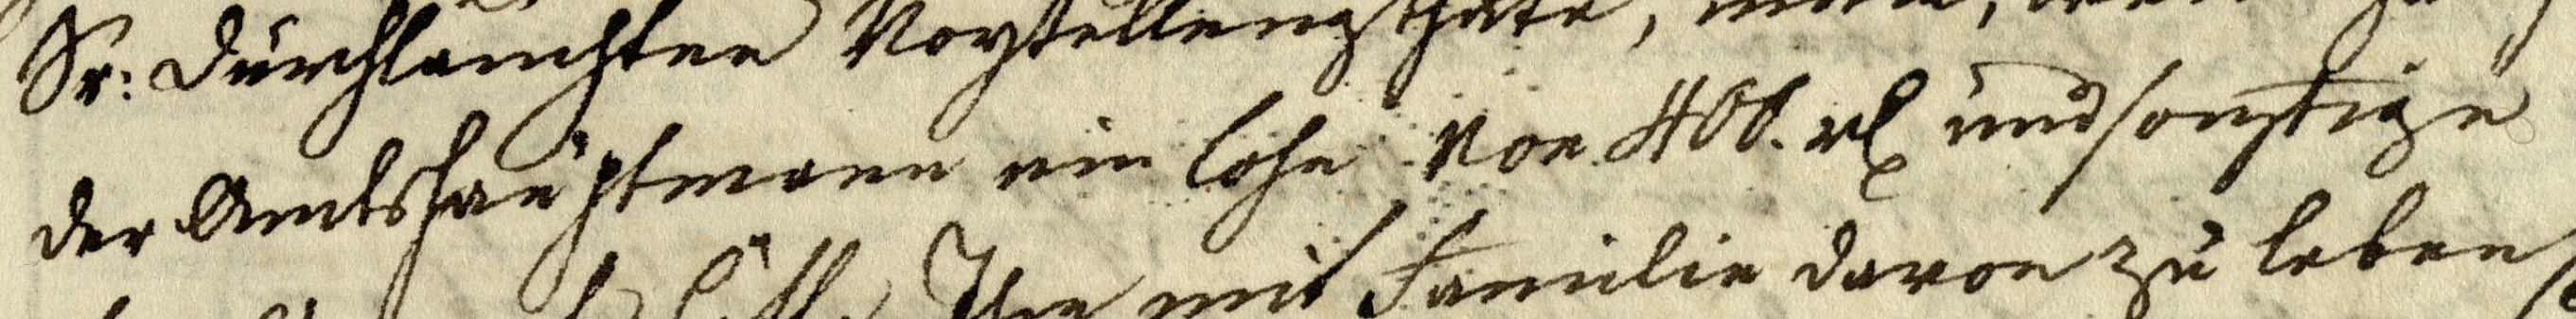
der Amtshauptmann ein Lohn. von 400. rl. und sonstige
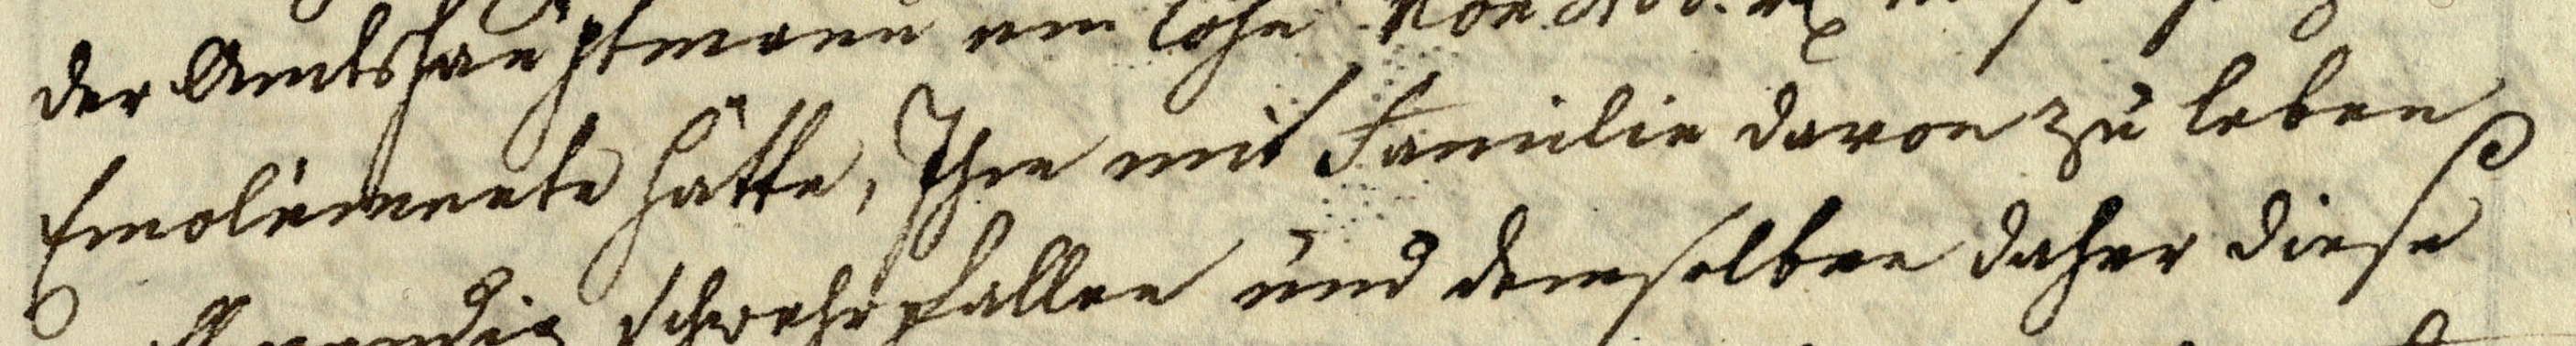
Emolumente hätte, Ihm mit Familie davon zu leben
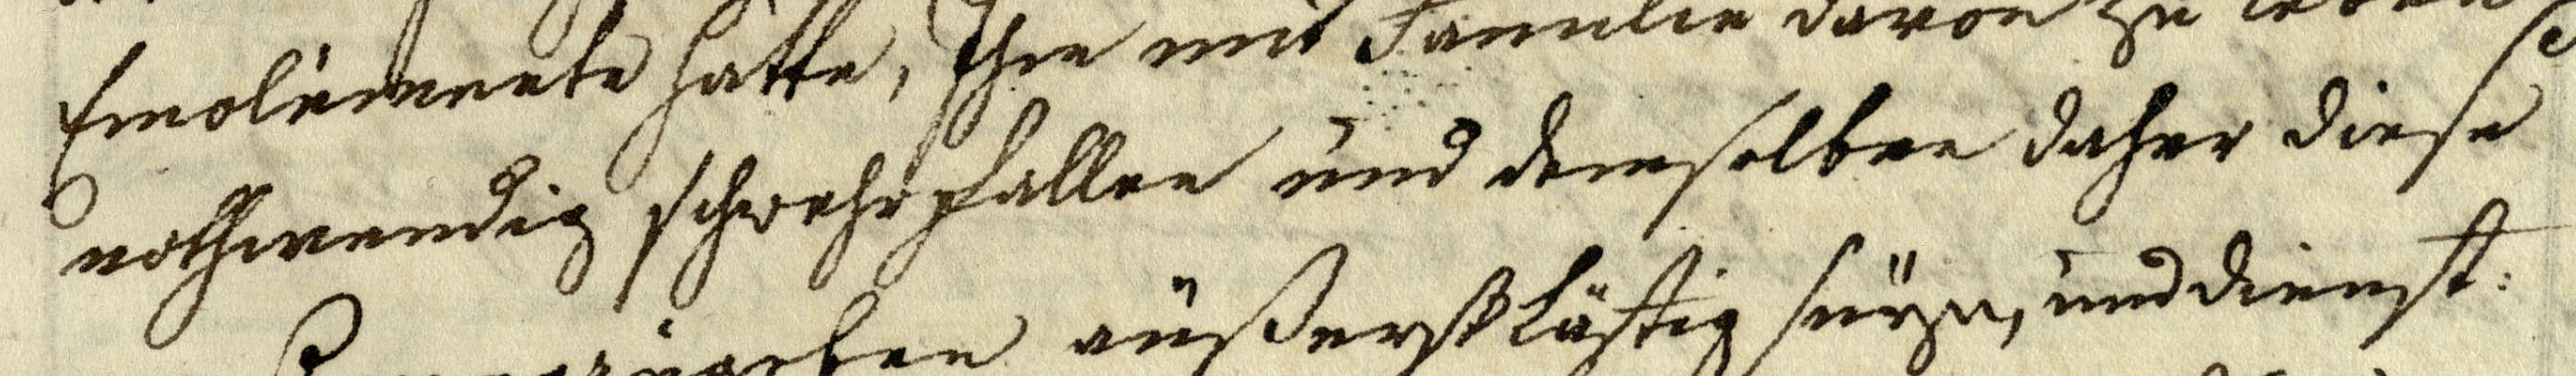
nothwendig schwehr fallen und demselben daher diese
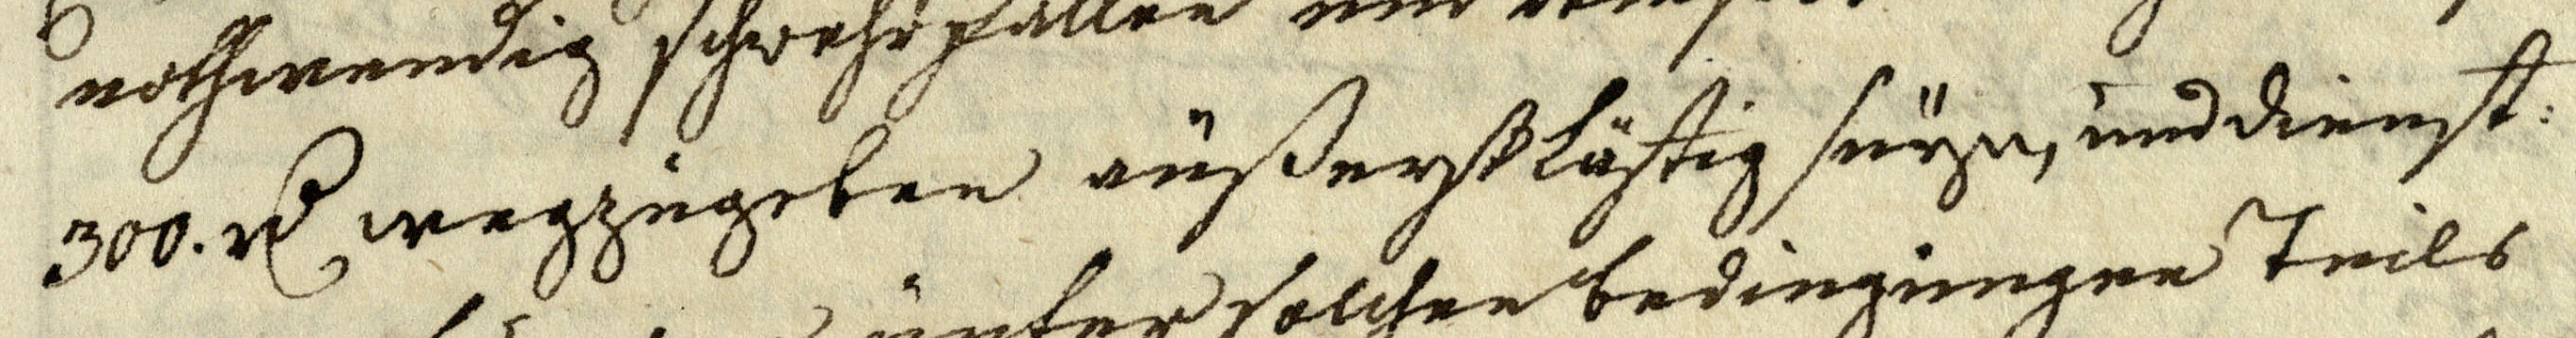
300. rl wegzugeben äußerst lästig seÿn, und Dienst¬
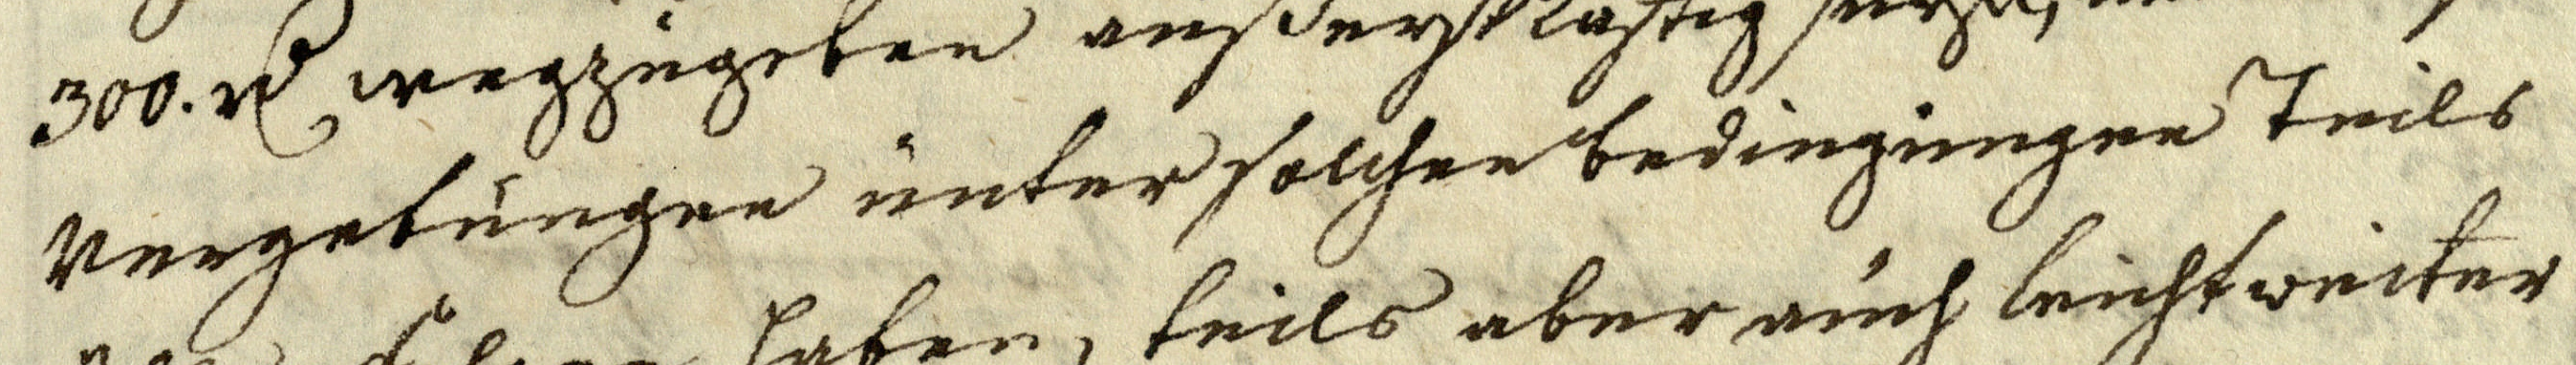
vergütungen unter solchen Bedingungen Teils
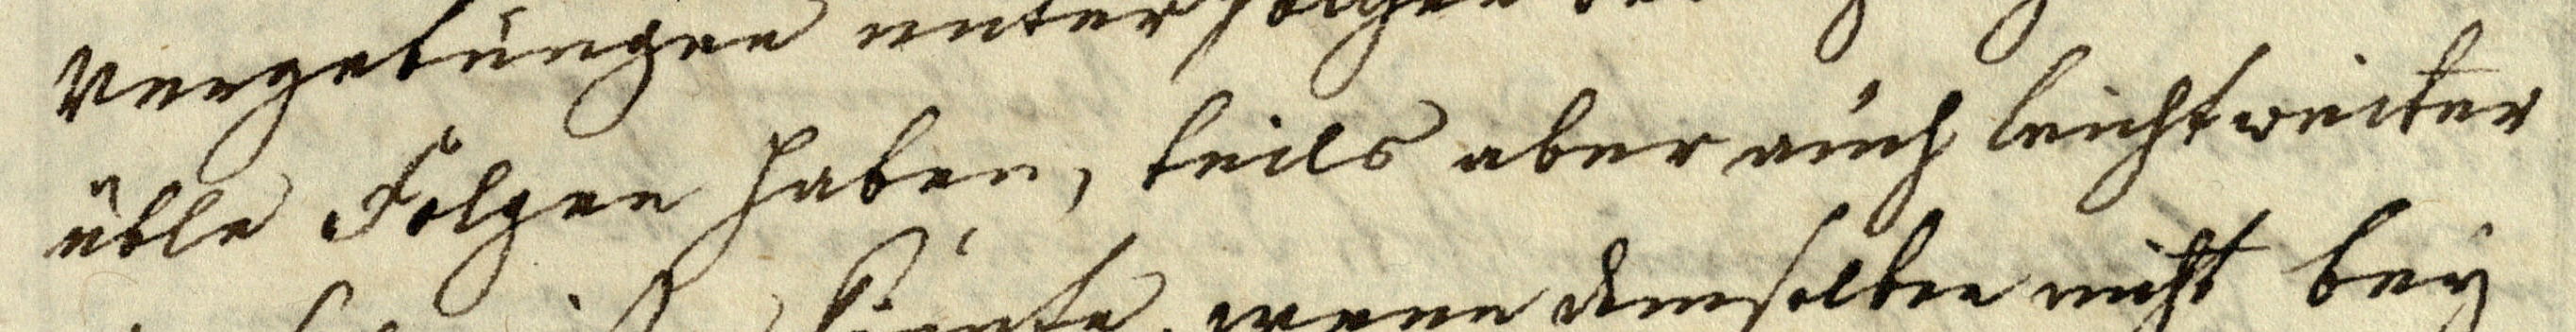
üble Folgen haben, theils aber auch leicht weiter
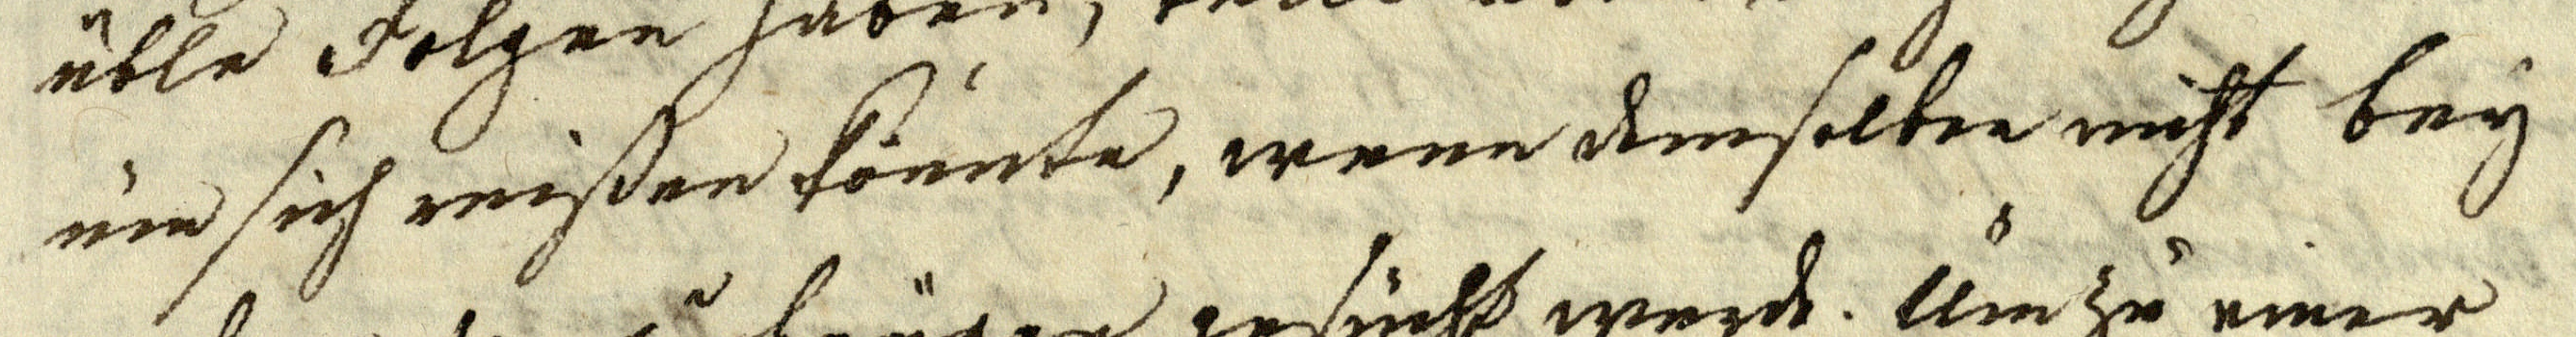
um sich reißen könnte, wenn demselben nicht beÿ
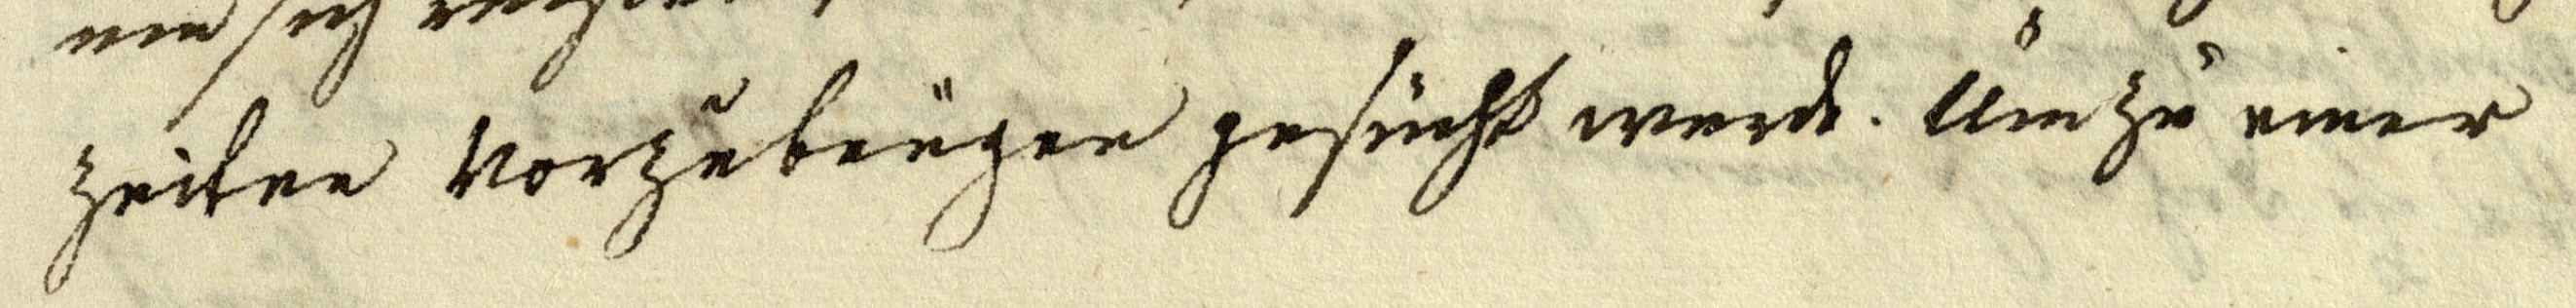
Zeiten vorzubeugen gesucht werde. Um zu einer
